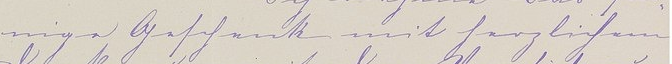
nige Geschenk mit herzlichem
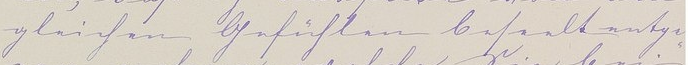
gleichen Gefühlen beseelt entge-
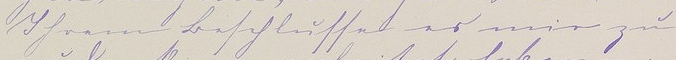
Ihrem Beschlusse es mir zu-
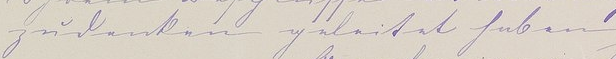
zudenken geleitet haben.
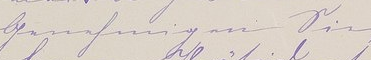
Genehmigen Sie,
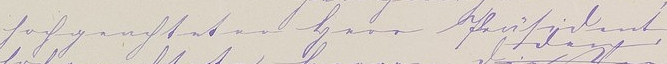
hochgeachteter Herr Präsident,
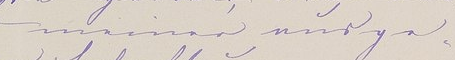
meiner ausge-
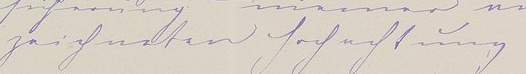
zeichneten Hochachtung
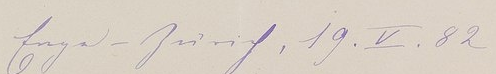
Enge-Zürich, 19. V. 82.
